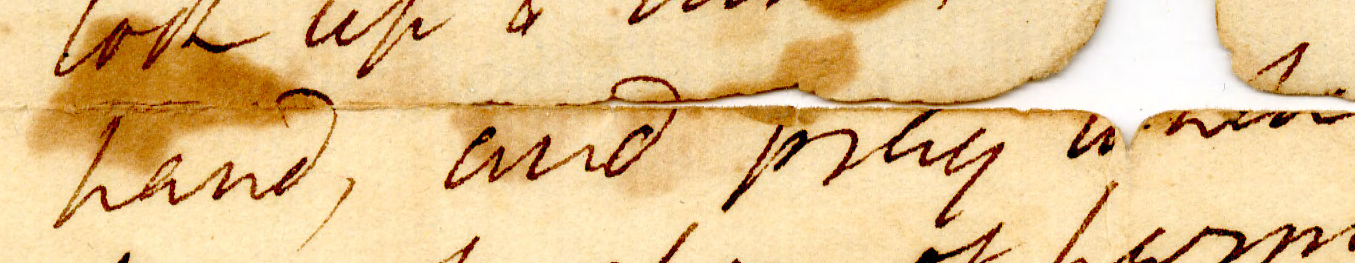hand, and play under
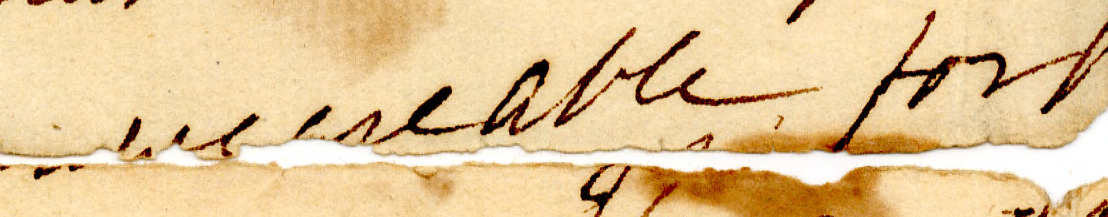[___] useable for
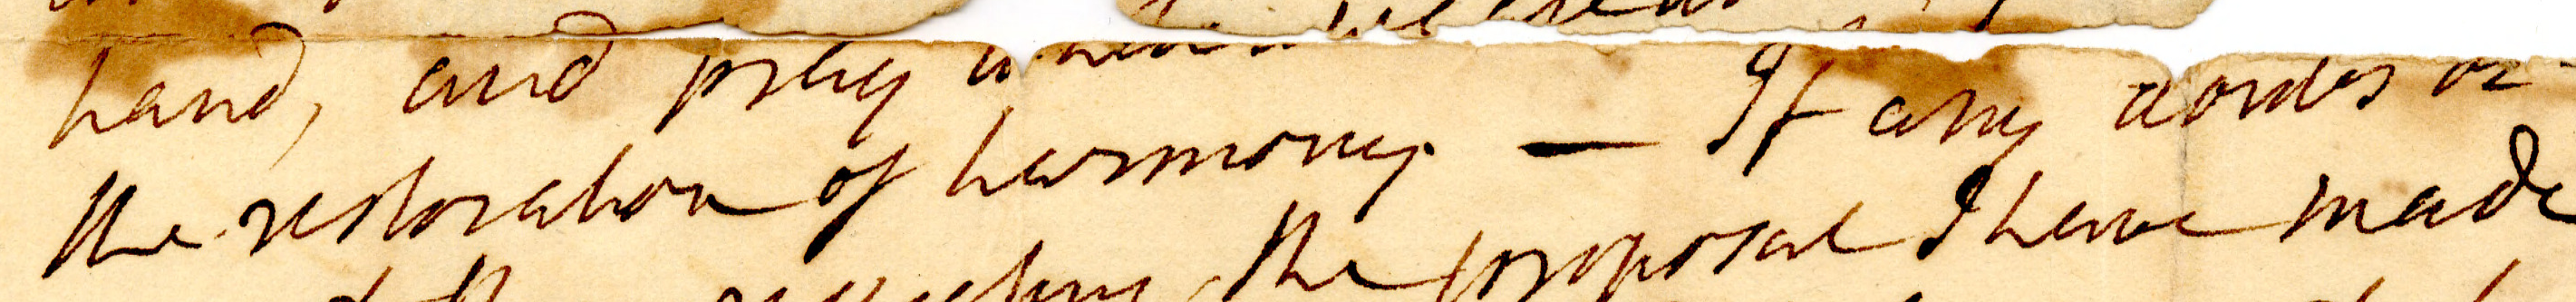the restoration of harmony- If any words or
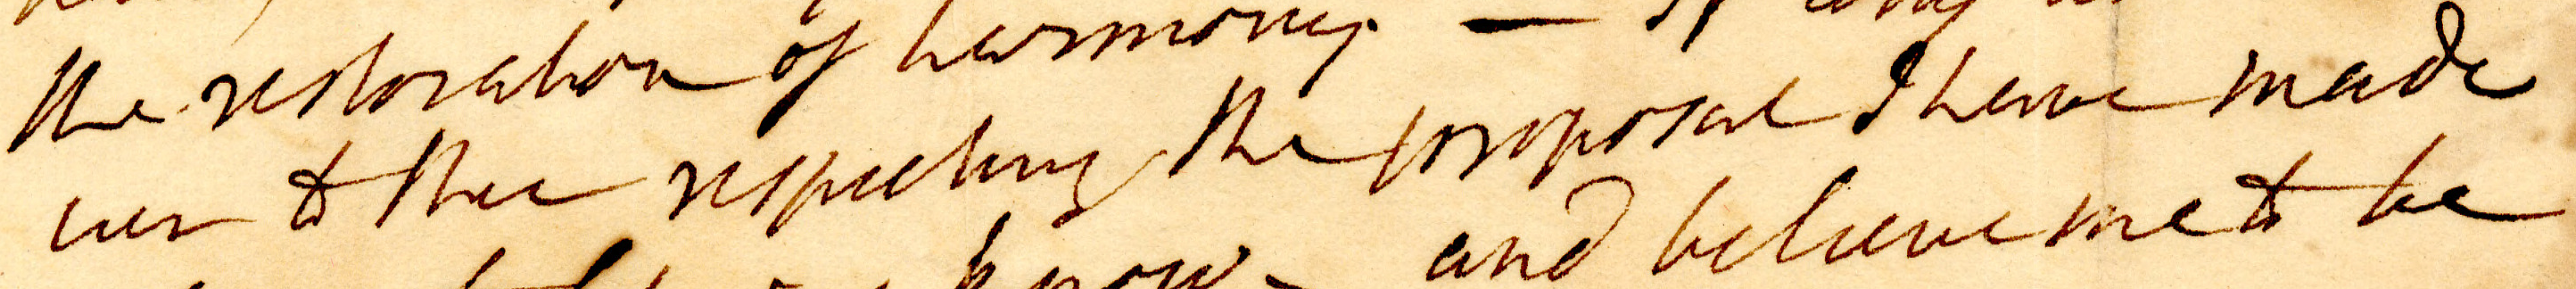her & thee respecting the proposal I have made
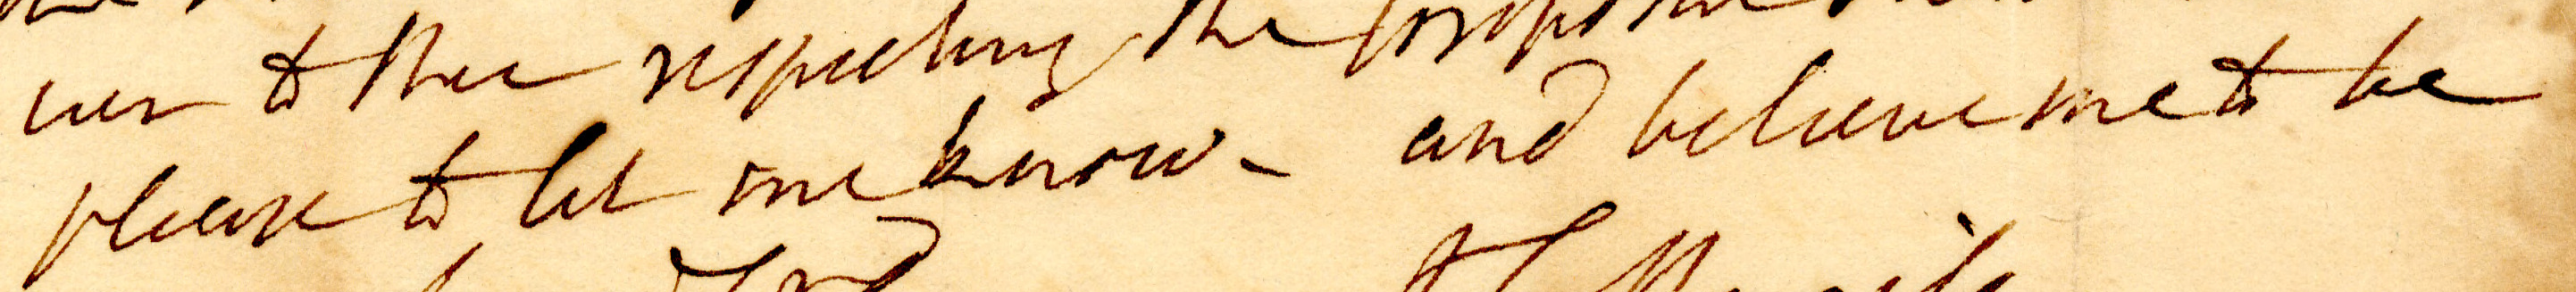please to let me know. and believe me to be
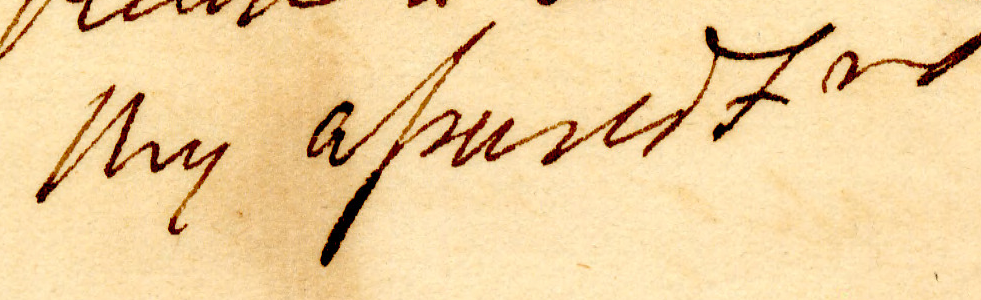thy assurd F^rd
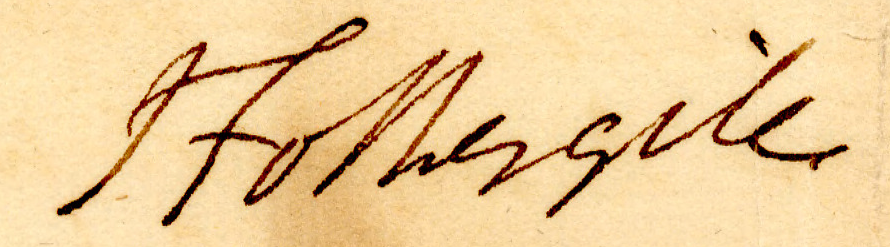J Fothergill
